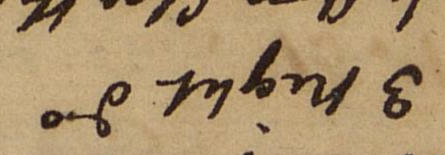3 Nights d^o
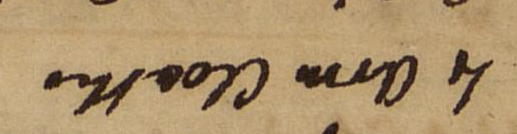4 Arm Cloaths
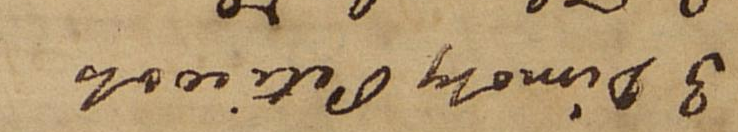3 Dimoty Peticoats
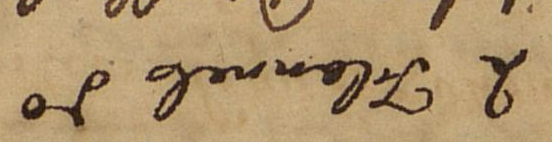2 Flannels d^o
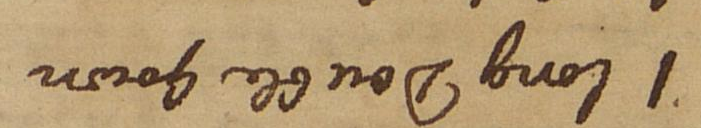1 long Double Gown
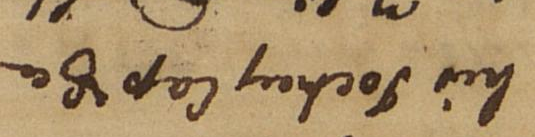his Jockey Cap &c
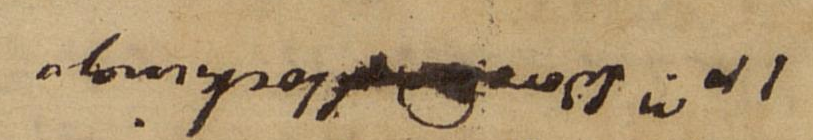1 p^r. Wors[____] tockings
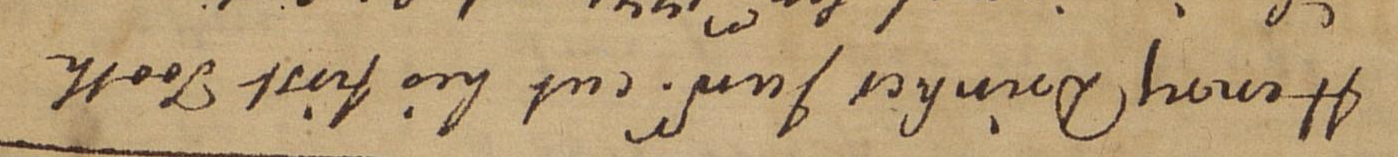Henry Drinker Jun^r. cut his first Tooth
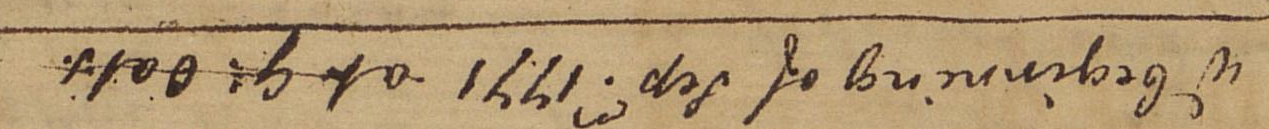y^e beginning of Sep^r. 1771 at G: Oats.
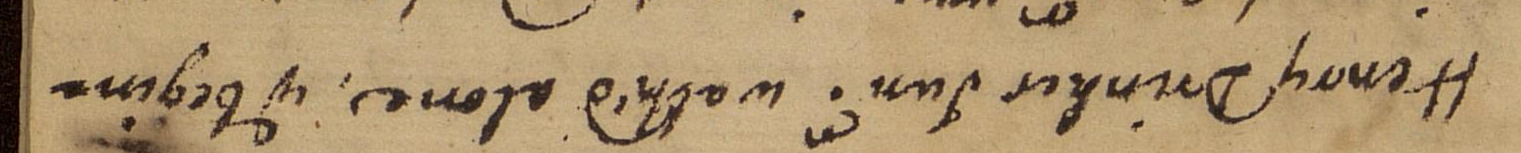Henry Drinker Jun^r. walk'd alone, y^e begin-
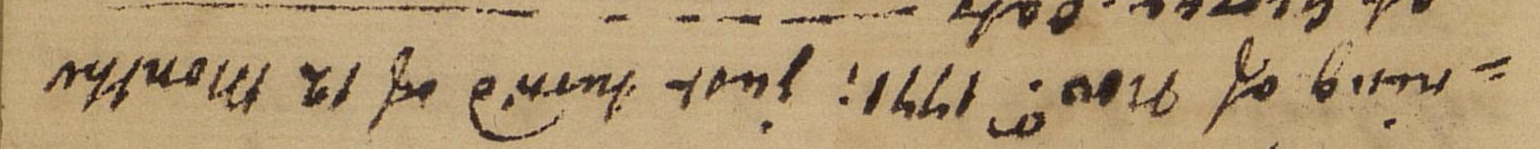-ning of Nov^r. 1771; just turn'd of 12 Months
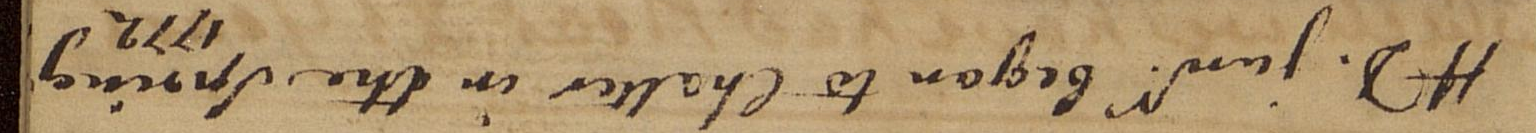HD. jun^r. began to Chalter in the Spring
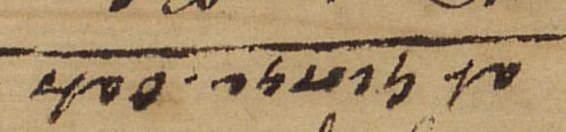at George. Oats
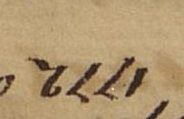1772
